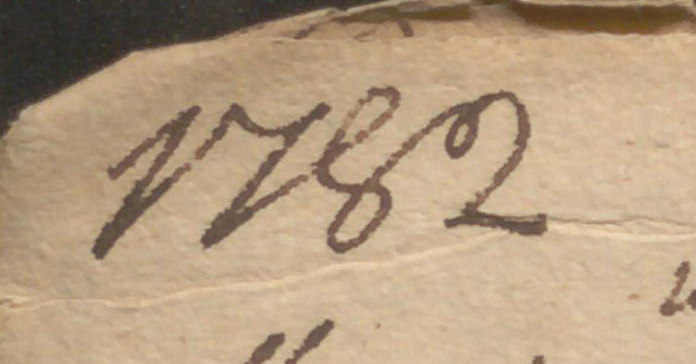1782
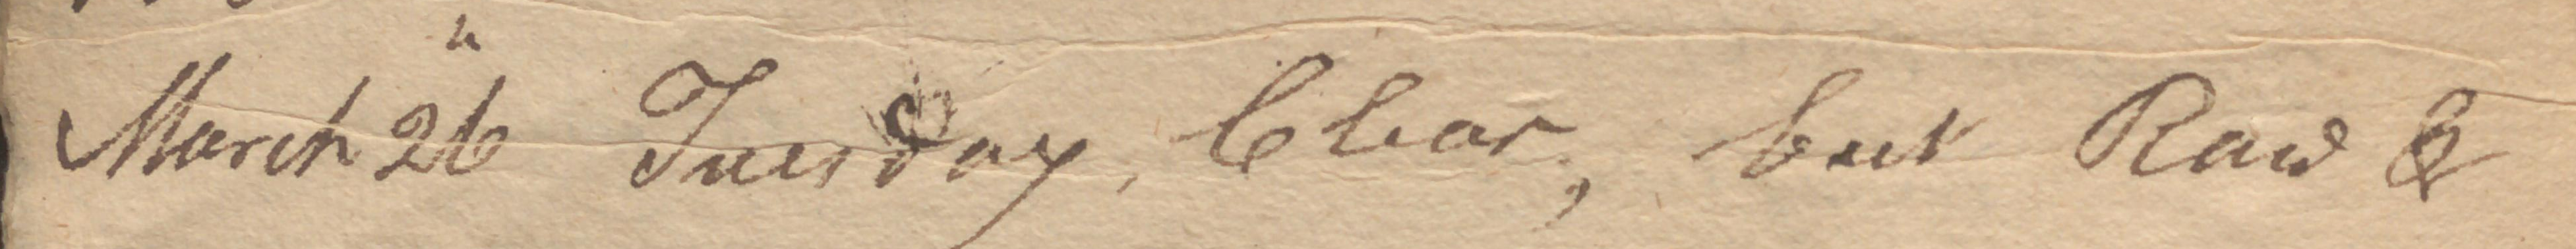March 26 Tuesday Clear, but Raw &
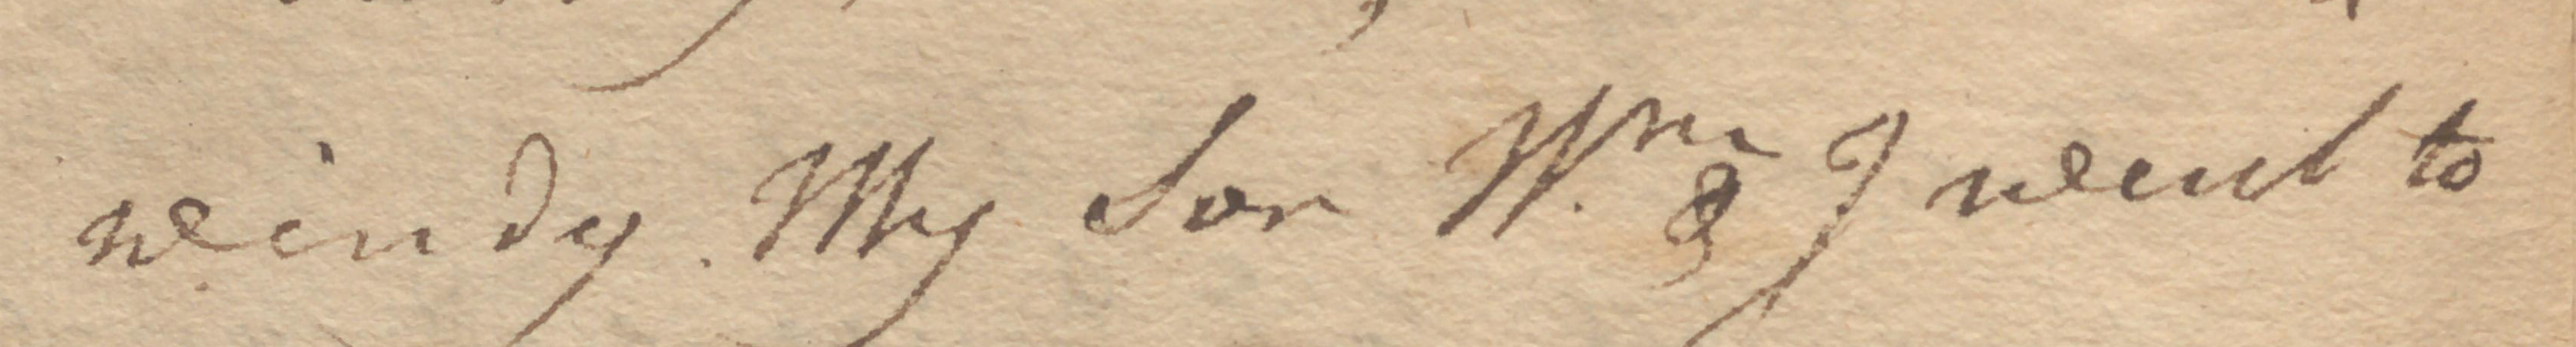windy My Son W^m. & I went to
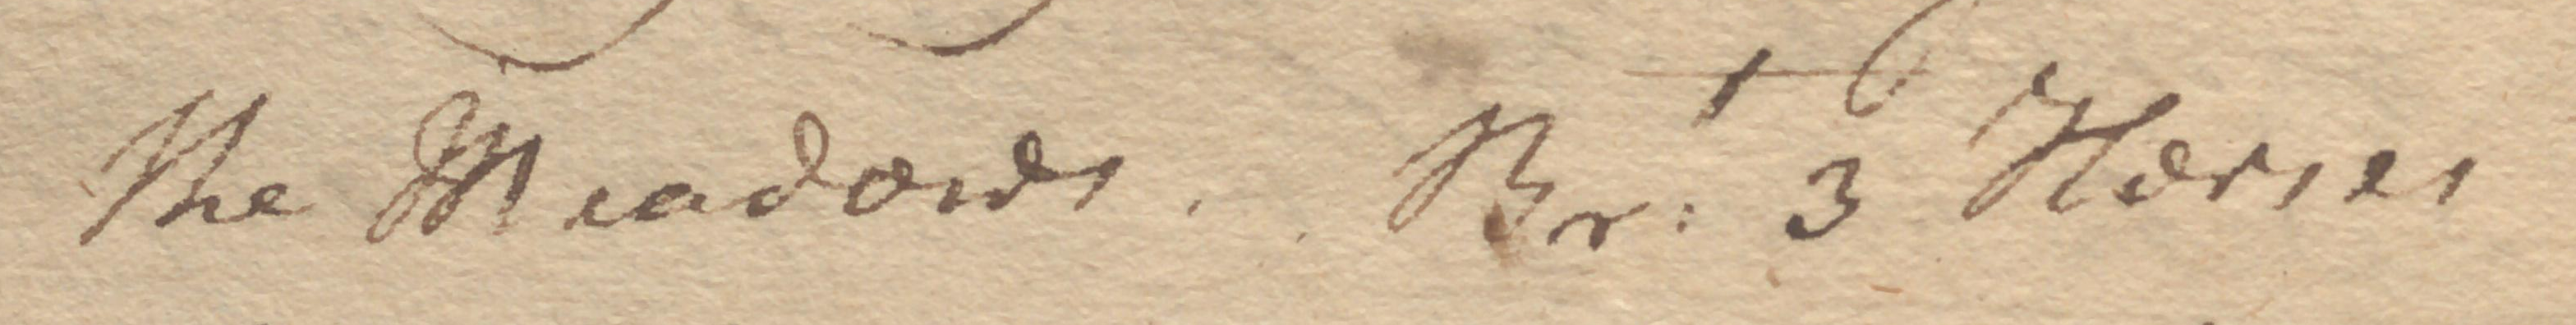the Meadows. Br^t. 3 Horses
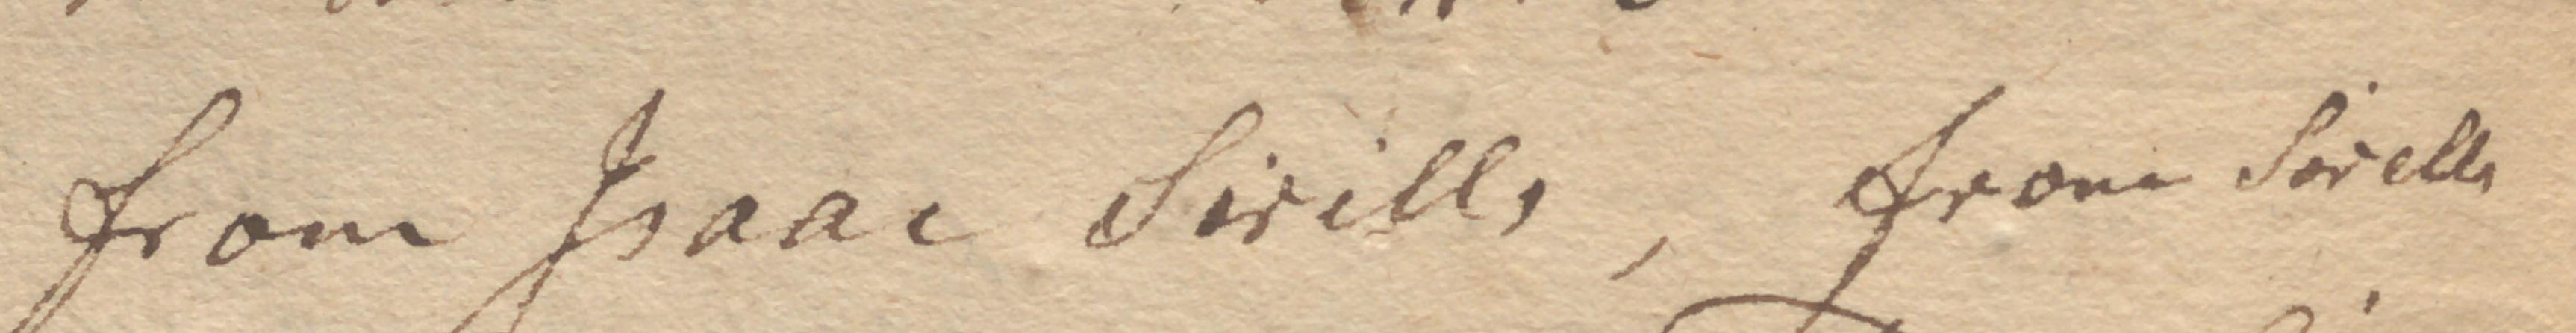from Isaac Sirills from Sirells
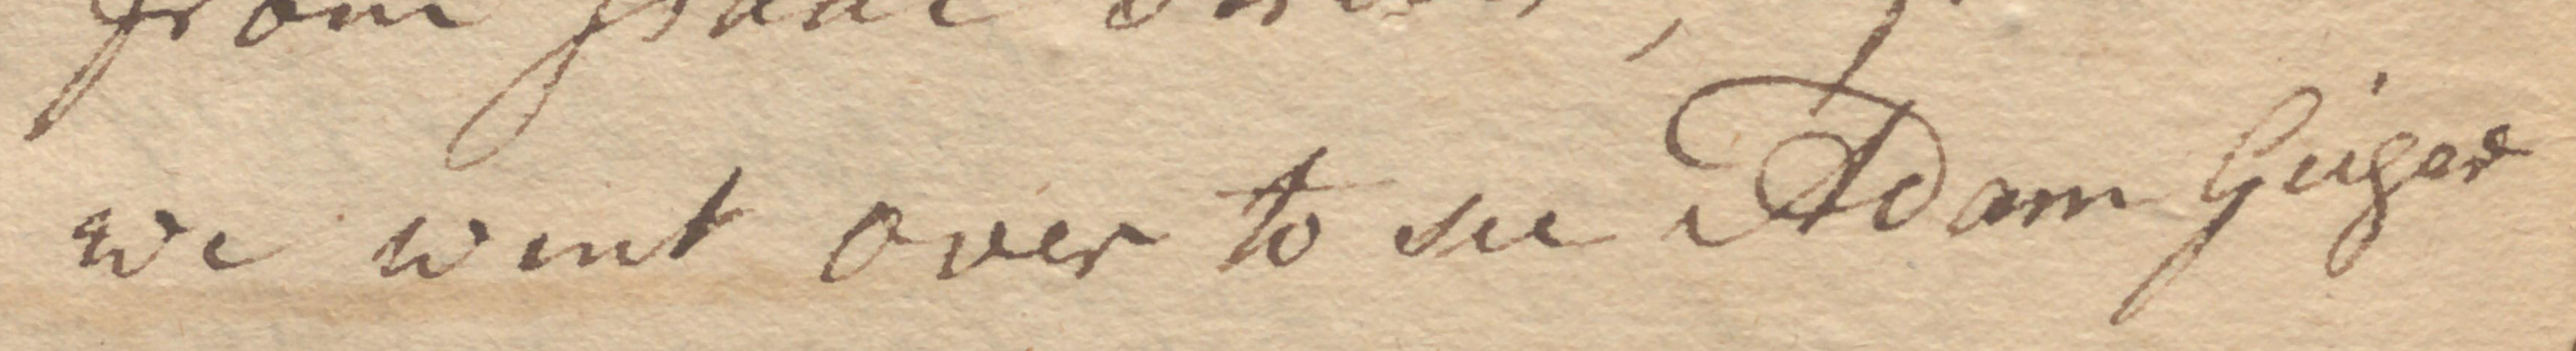we went over to see Adam Geiger
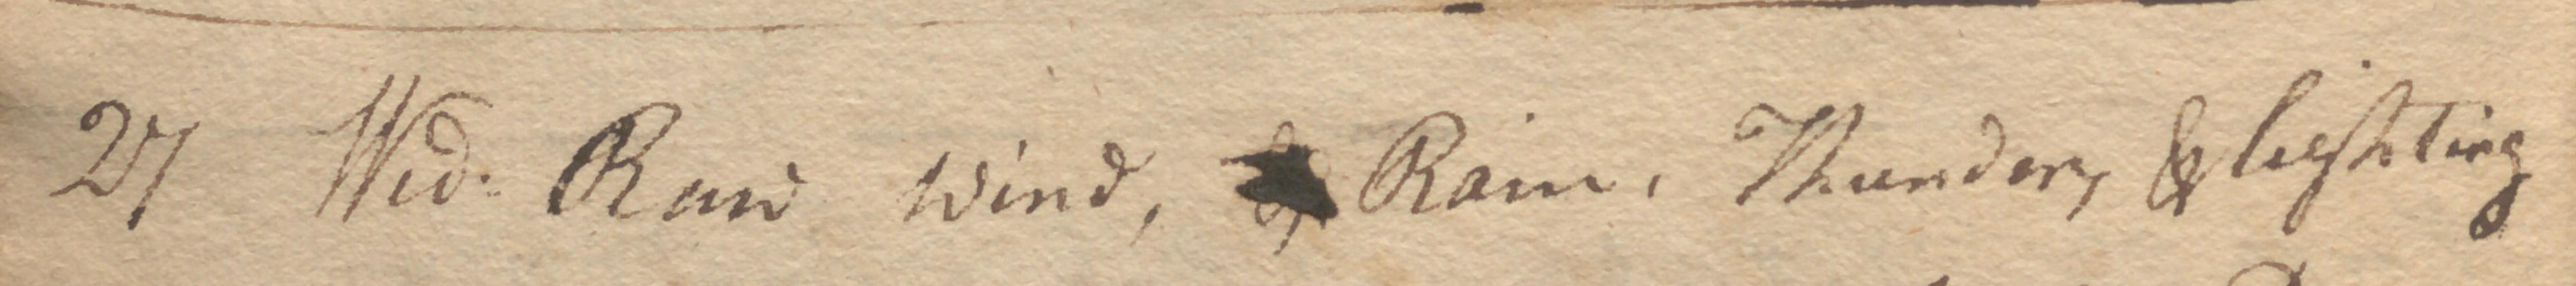27 Wed. Raw wind, [&] Rain. Thundery & lighting
